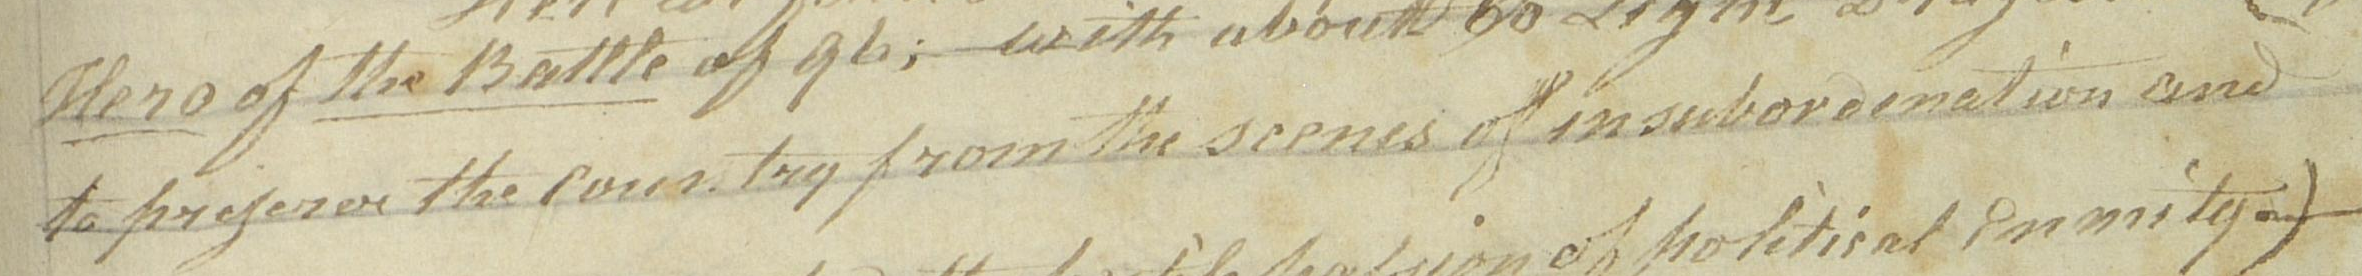to preserve the country from the scenes of insubordination and
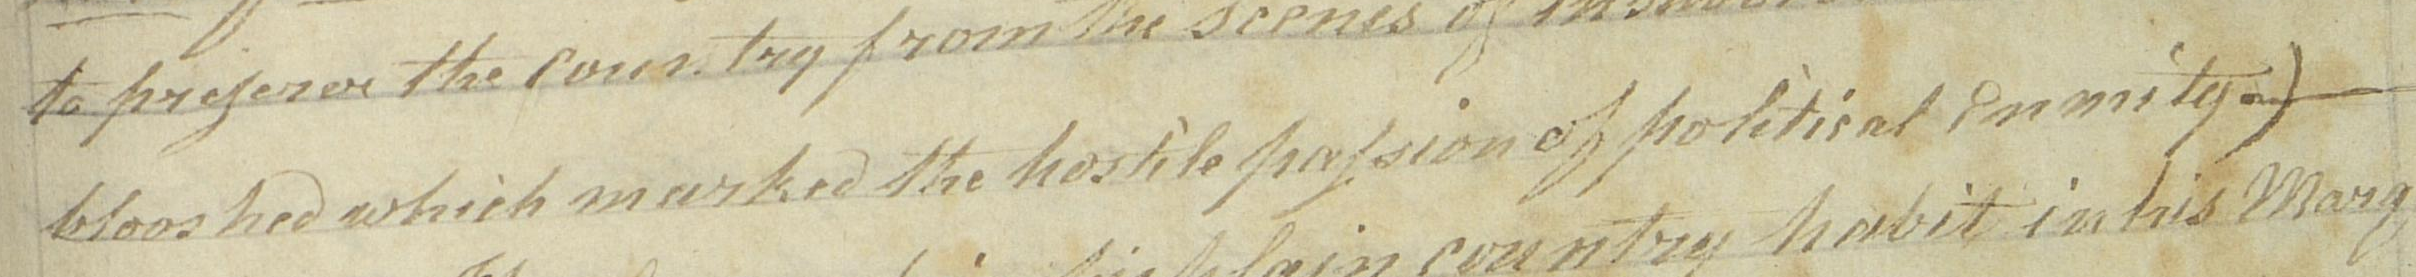blooshed which marked the hostile passion of political Enmity.)
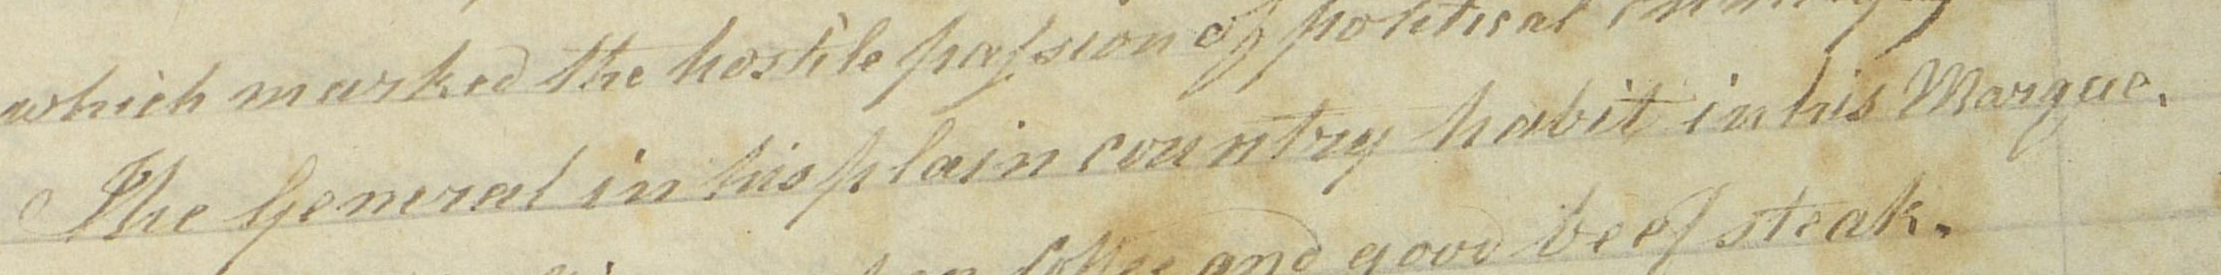The General in his plain country habit in his Marque.
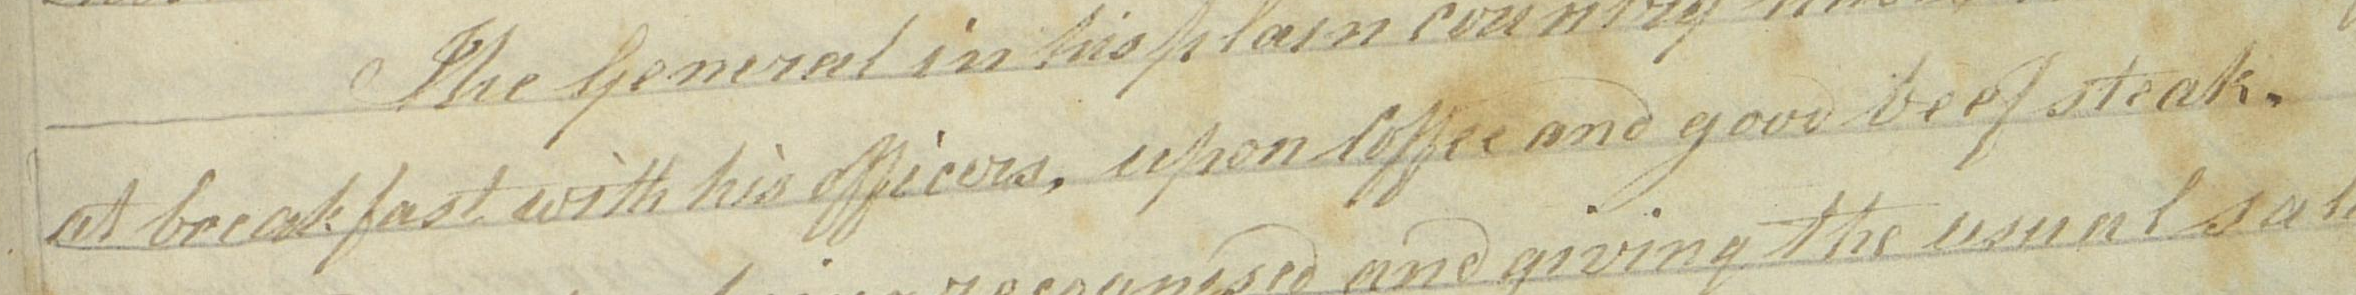at breakfast with his officers, upon Coffee and good beef steak.
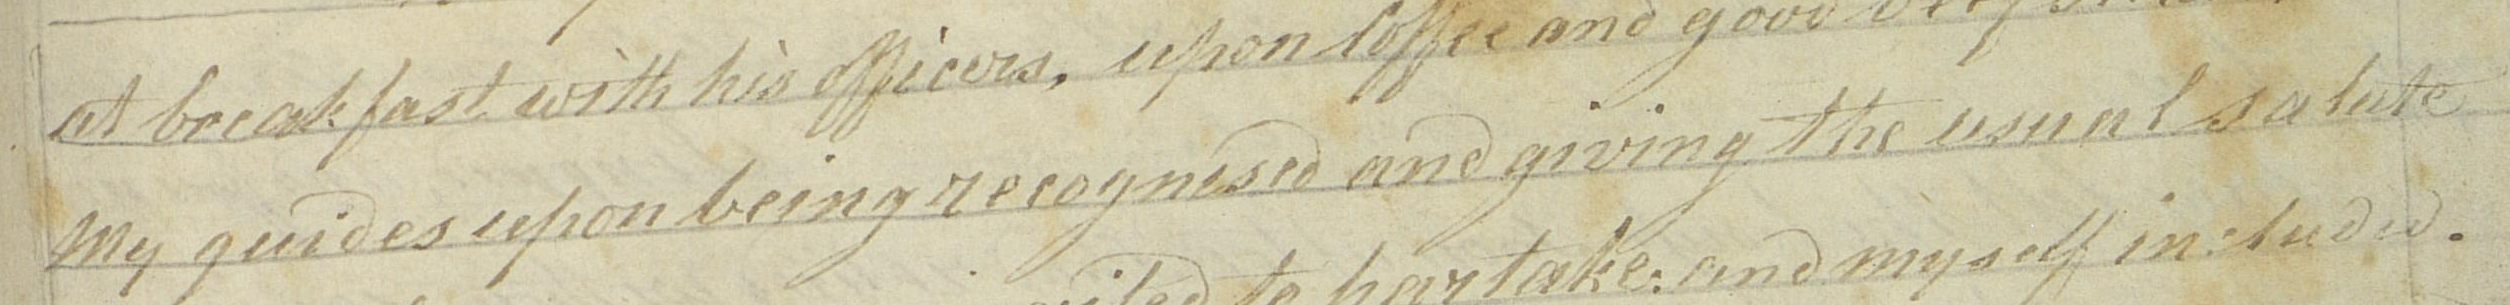My guides upon being recognised and giving the usual salute
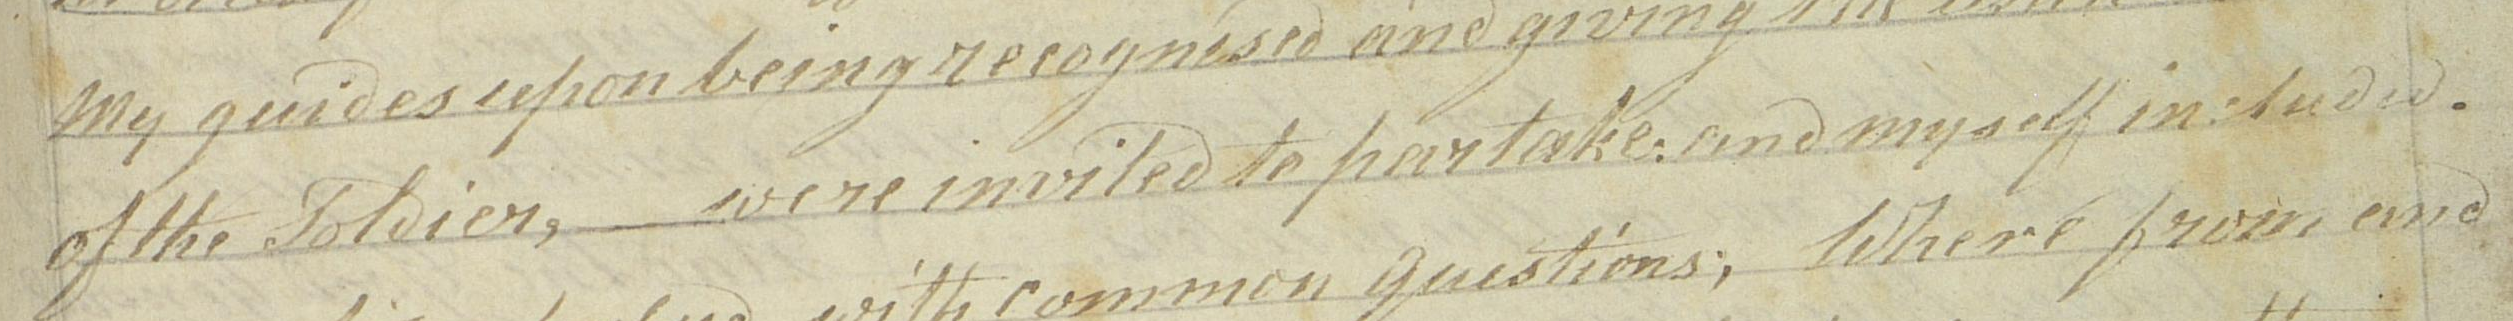of the Soldier, were invited to partake: and myself included.
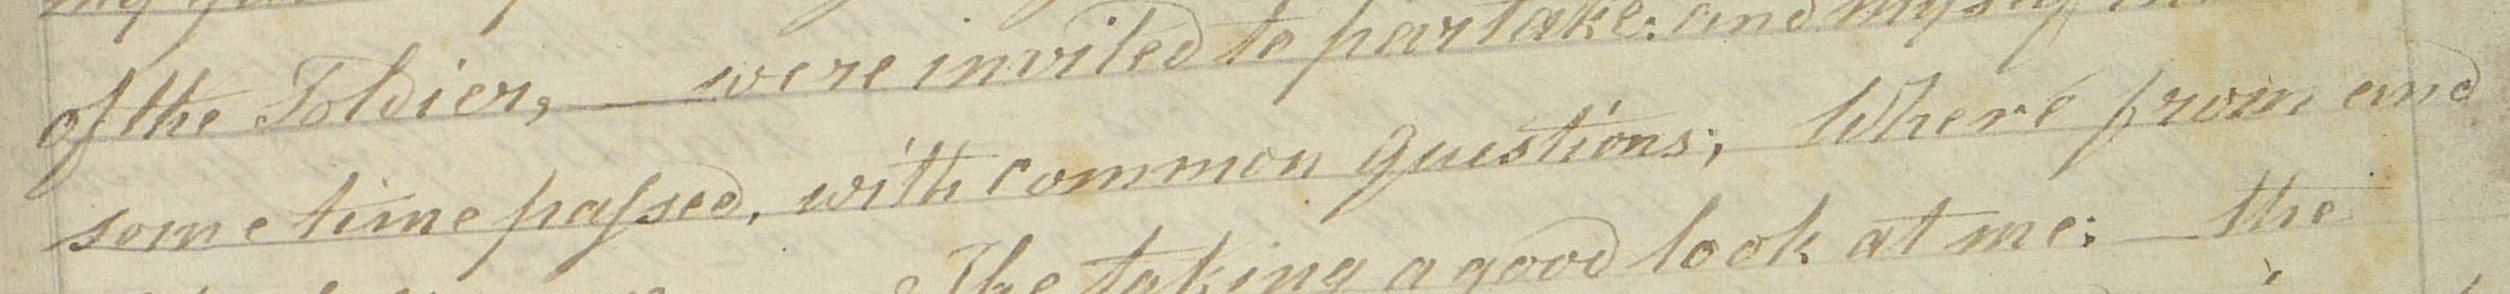some time passed, with common questions; Where from and
